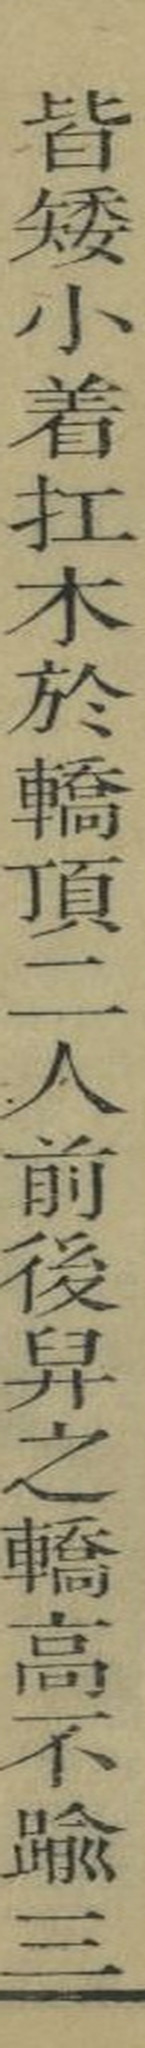皆矮小着扛木於轎頂二人前後舁之轎高不踰三
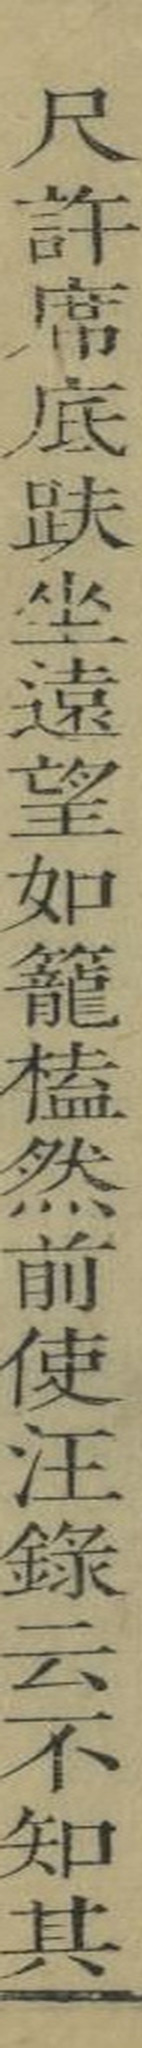尺許席底趺坐遠望如篭榼然前使汪録云不知其
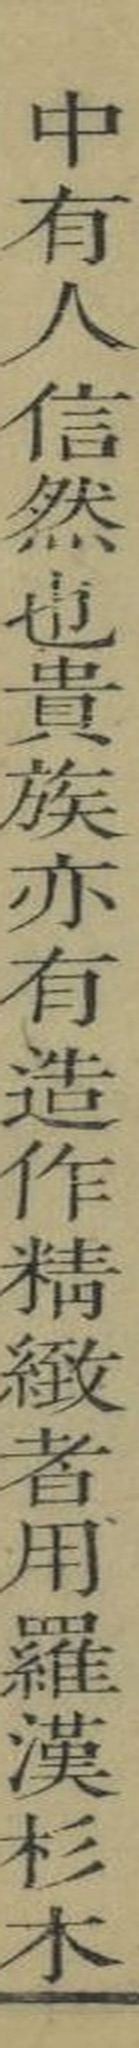中有人信然也貴族亦有造作精緻者用羅漢杉木
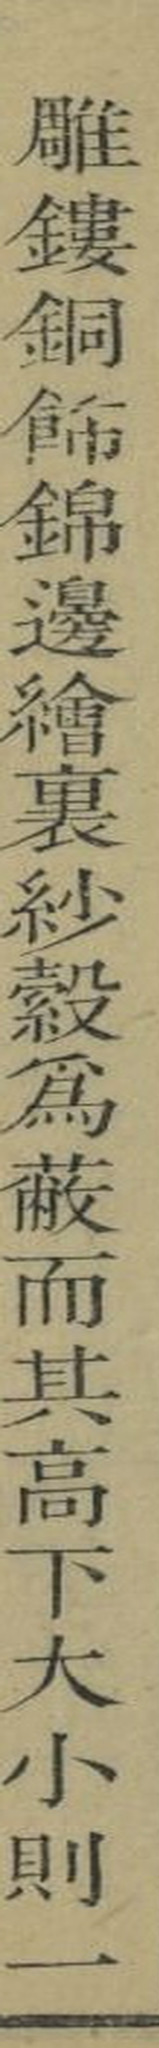雕鏤銅飾錦辺絵裏紗縠為蔽而其高下大小則一
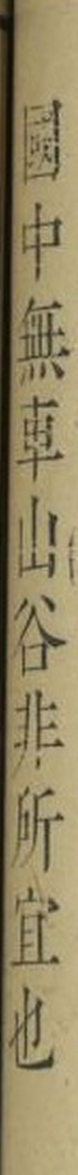国中無車山谷非所宜也

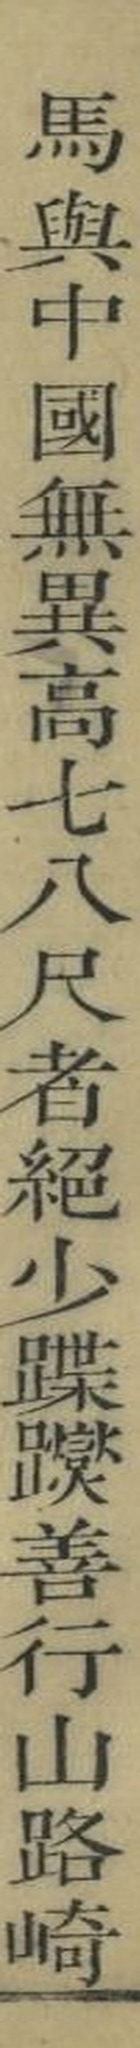馬与中国無異高七八尺者絶少蹀躞善行山路崎
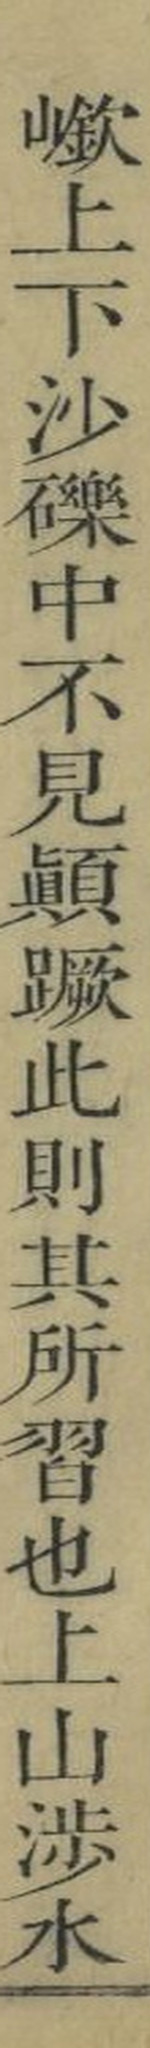嶔上下沙礫中不見顚蹶此則其所習也上山渉水
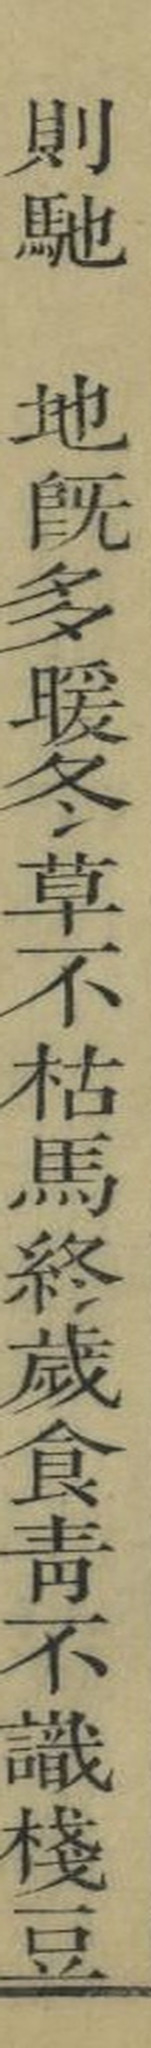則馳地既多暖冬草不枯馬終歳食青不識桟豆
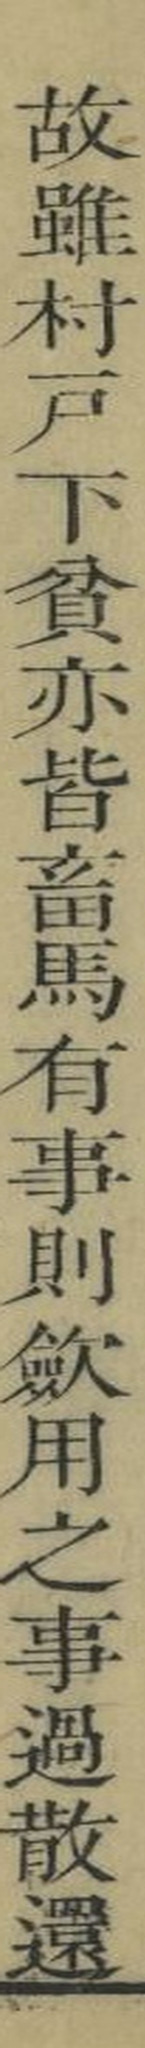故雖村戸下貧亦皆畜馬有事則歛用之事過散還
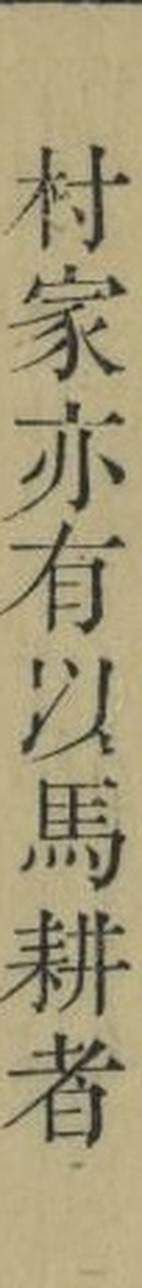村家亦有以馬耕者
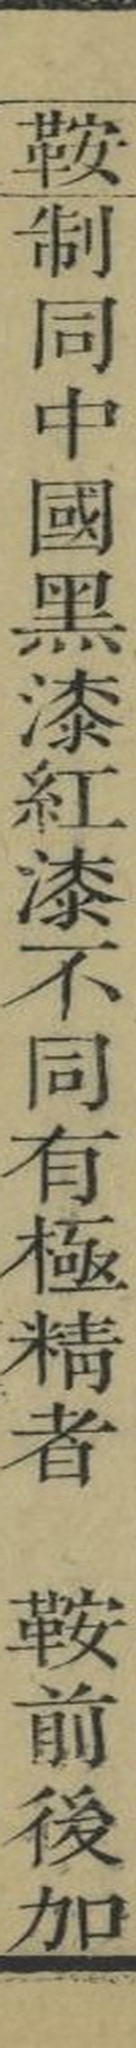[鞍]制同中国黒漆紅漆不同有極精者鞍前後加
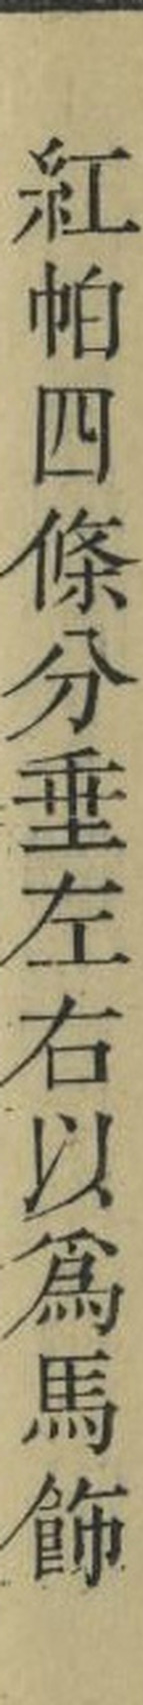紅帕四条分垂左右以為馬飾
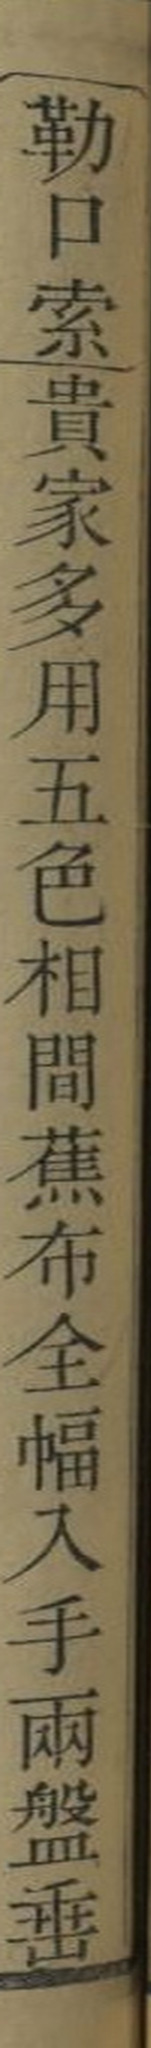[勒口索]貴家多用五色相間蕉布全幅入手両盤垂
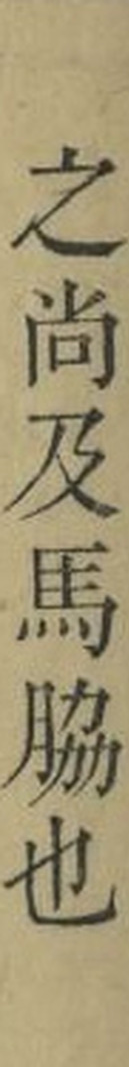之尚及馬脇也
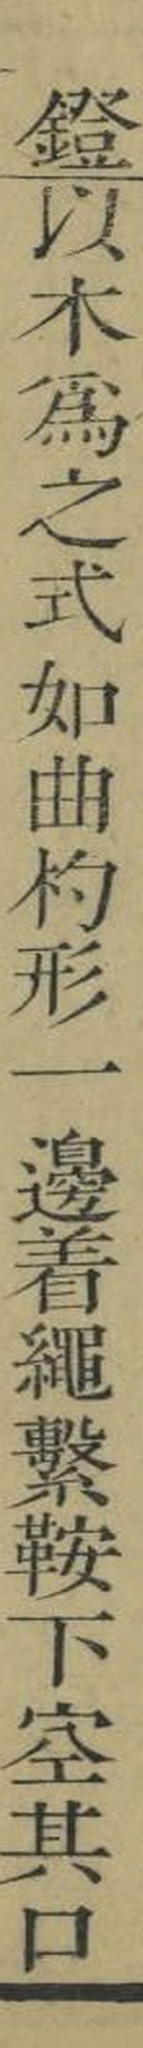[鐙]以木為之式如曲杓形一辺着縄繋鞍下空其口
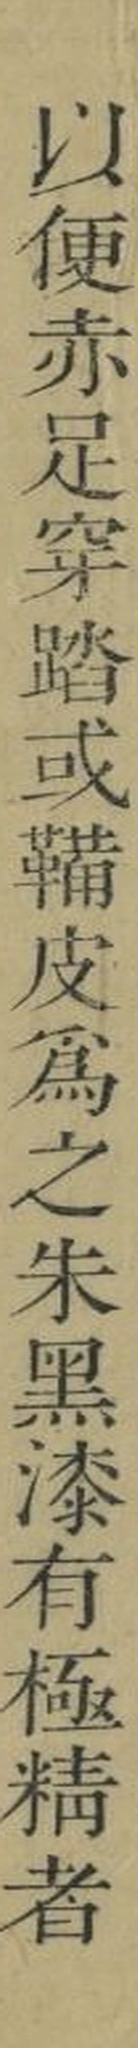以便赤足穿踏或鞴皮為之朱黒漆有極精者
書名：中山伝信録 巻六
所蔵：University of the Ryukyus Library
